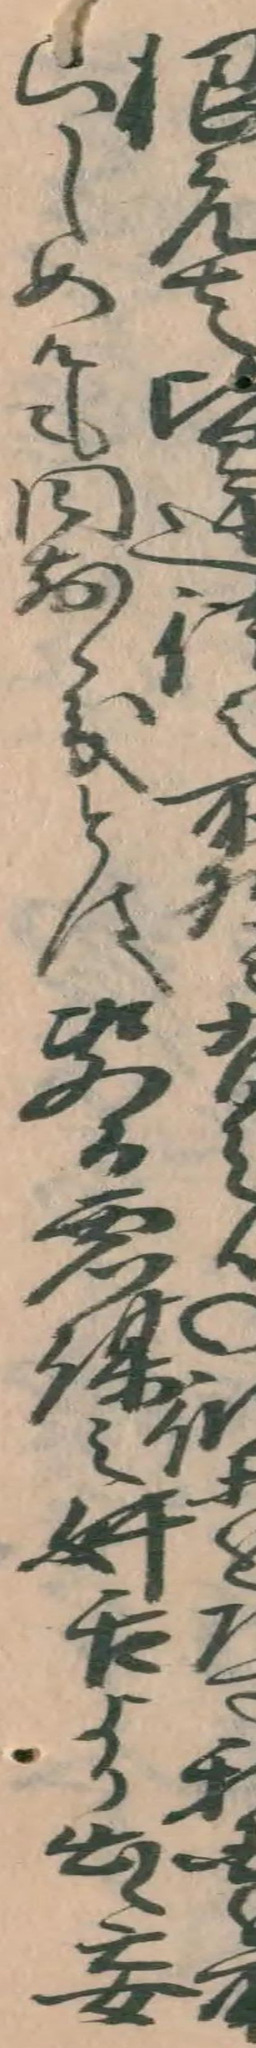らしめ候も同前之義とは決而悪謀之奸舌より出候妄
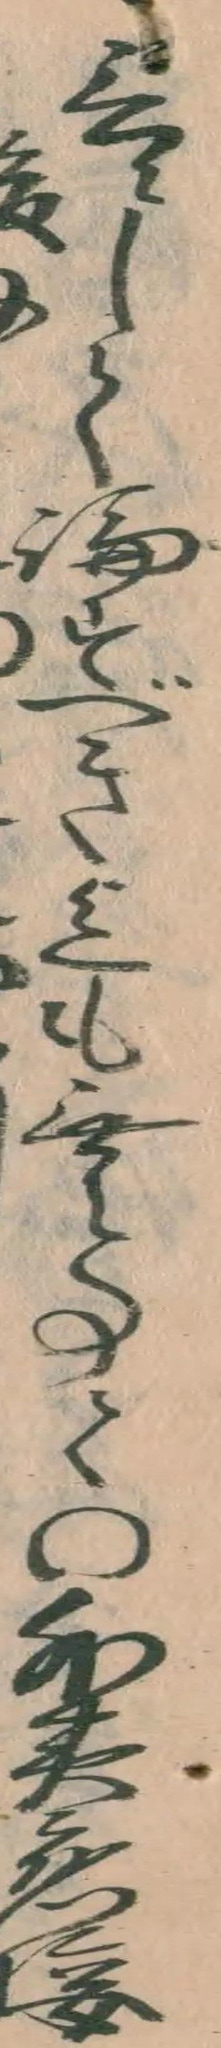言ニして論すべき迄も無之事ニ候〇外夷應接
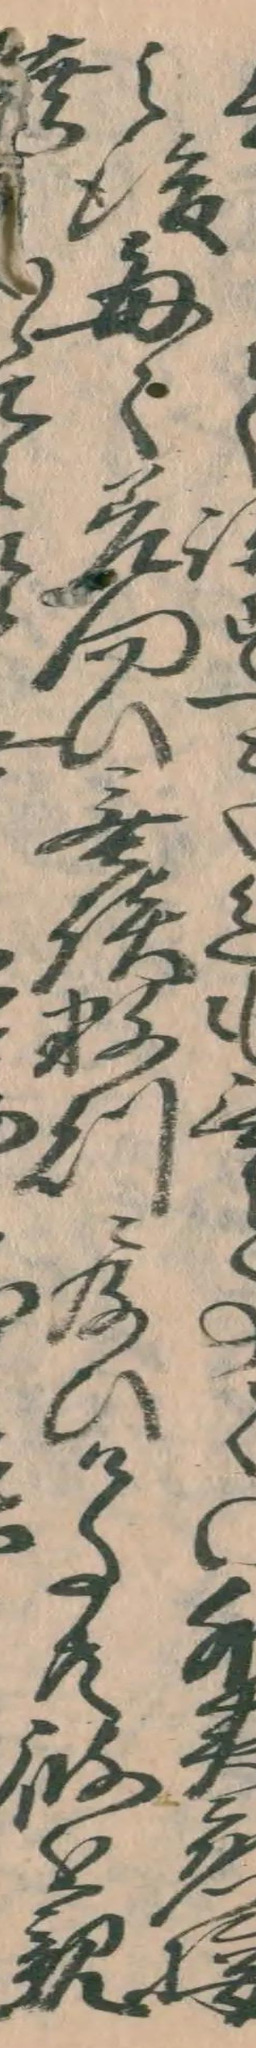之後毎々差向ひ密談数刻ニ及ひ候事共彼を親
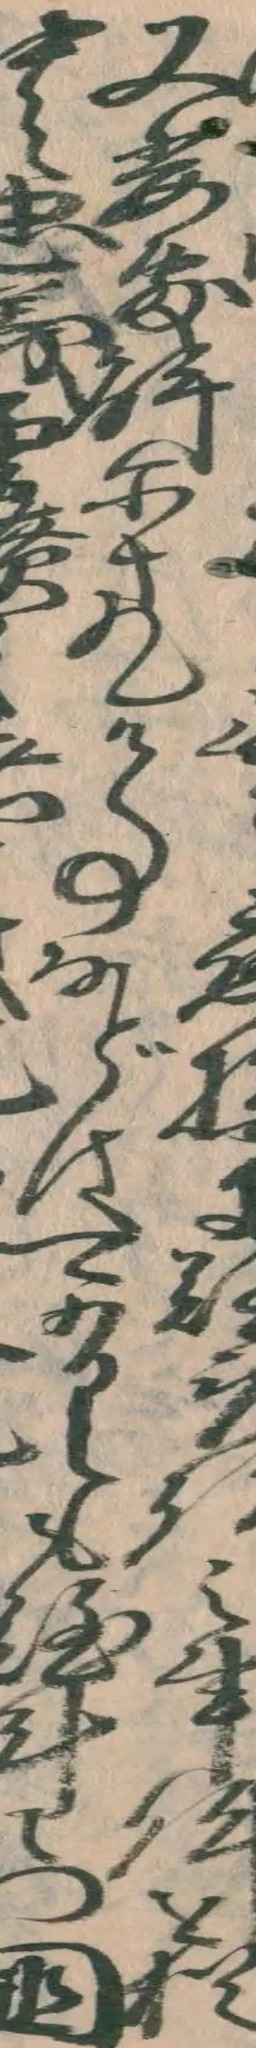又委敷解示され候事などは可有之も難斗候〇国
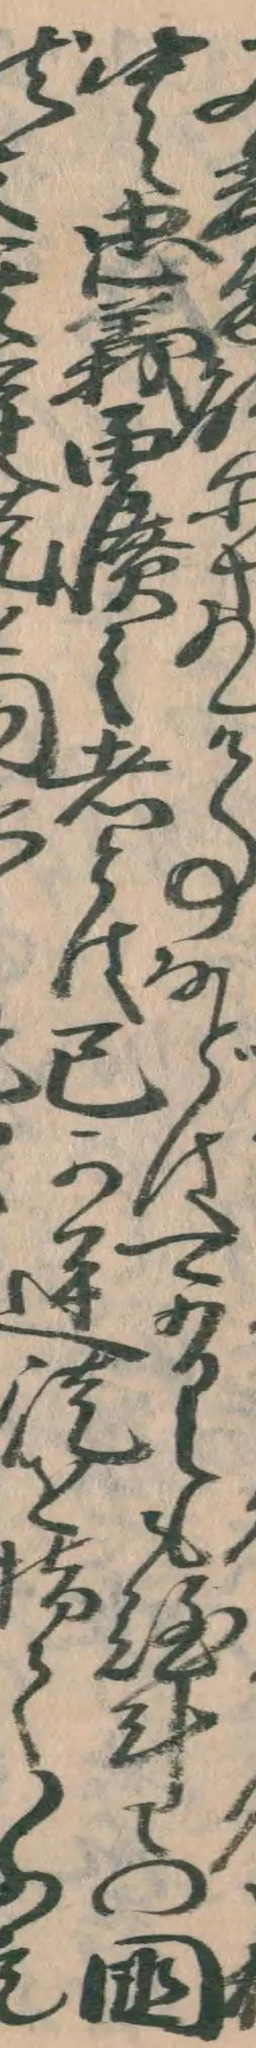中之忠義勇憤之者とは己か逆徒を指ていう欤
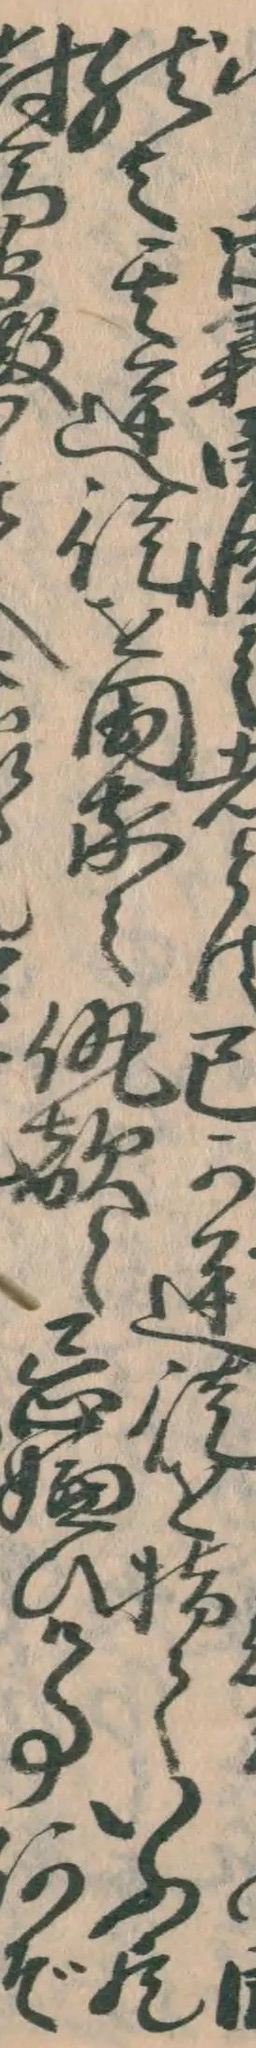然者其逆徒を国家の仇敵と忌嫌ひ候事何ぞ
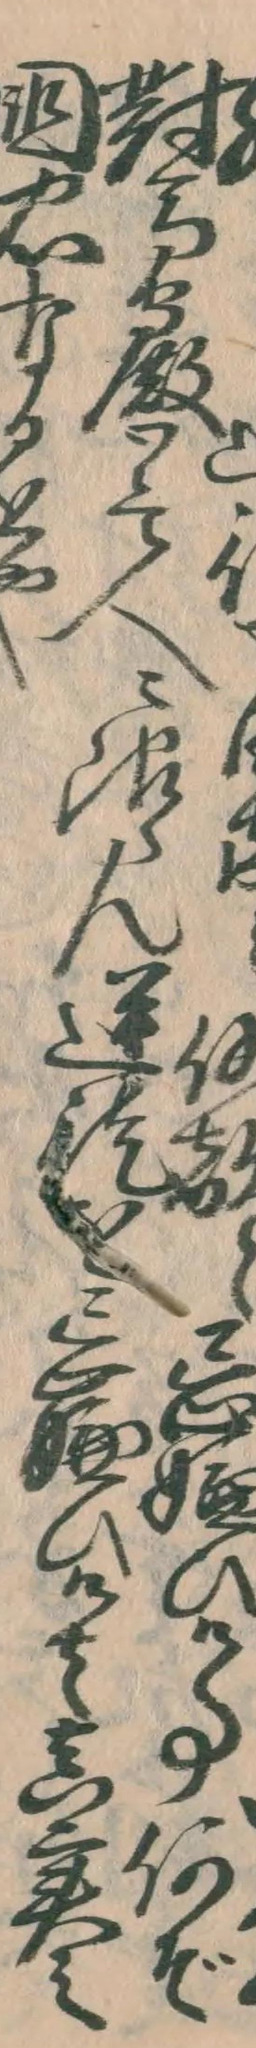對馬守殿御壱人ニ限らん逆徒を忌嫌ひ候者真実之
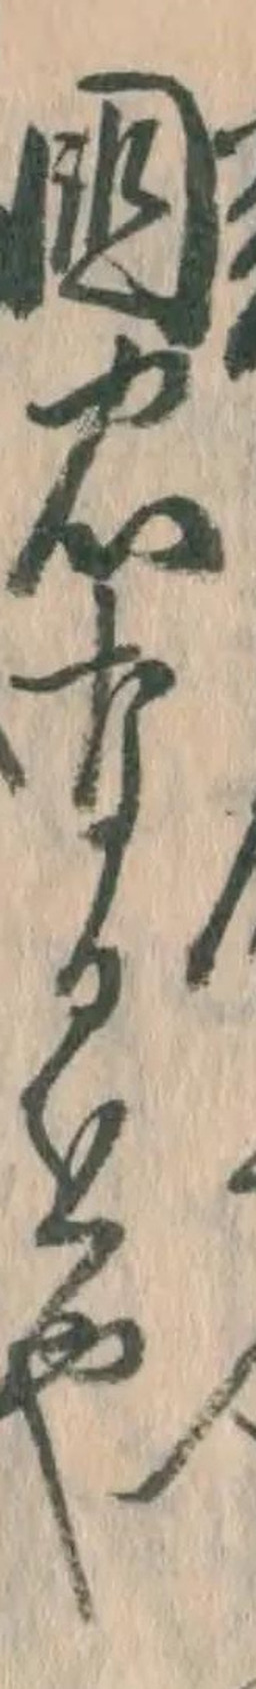国忠なるをや
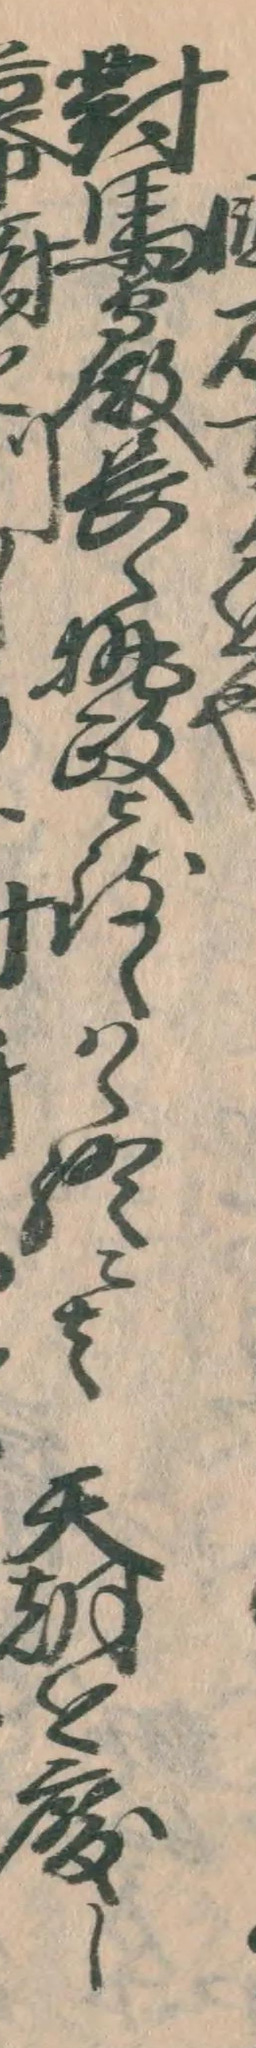對馬守殿長く執政被致候ハヽ終ニ者天朝を廃し
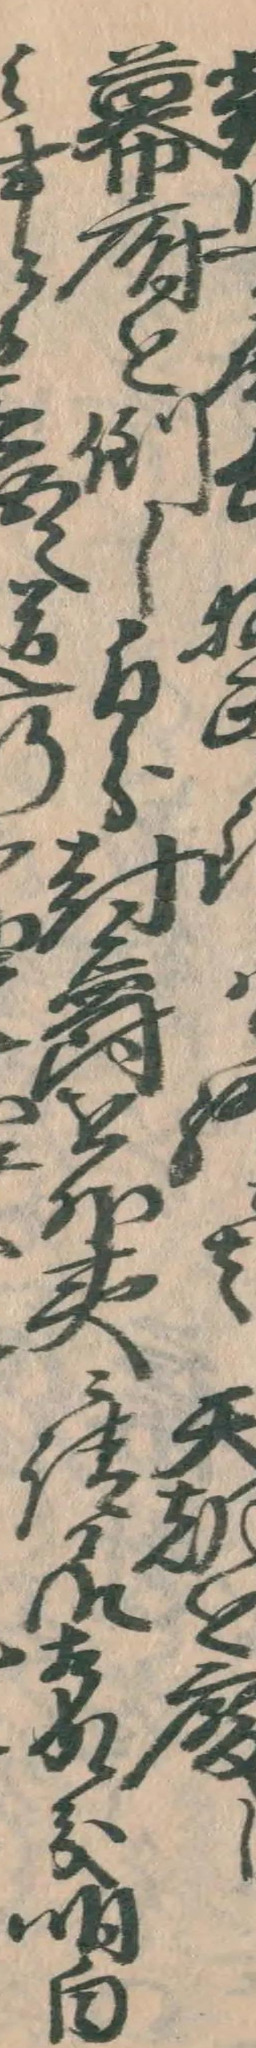幕府を倒し自ら封爵を外夷ニ請候様相成候義明白
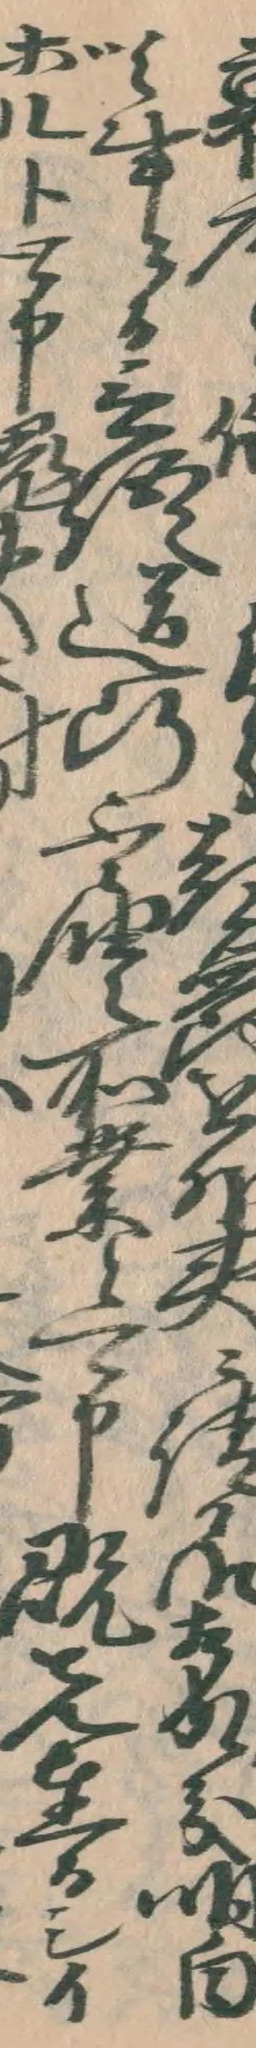之事ニ而言語道断不届之所業と可申既先達而シイ
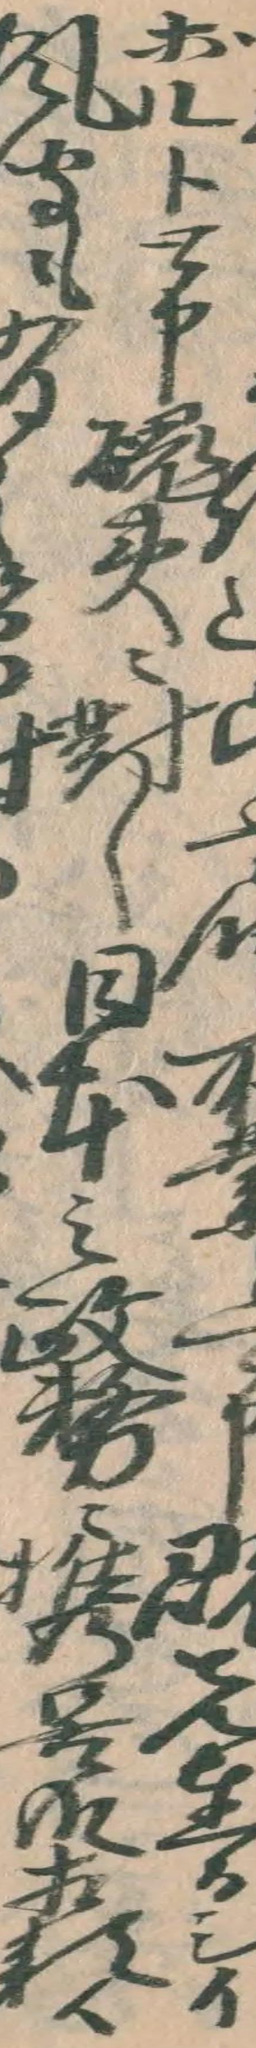ボルトと申醜夷ニ對し日本之政務ニ携呉候様相頼候
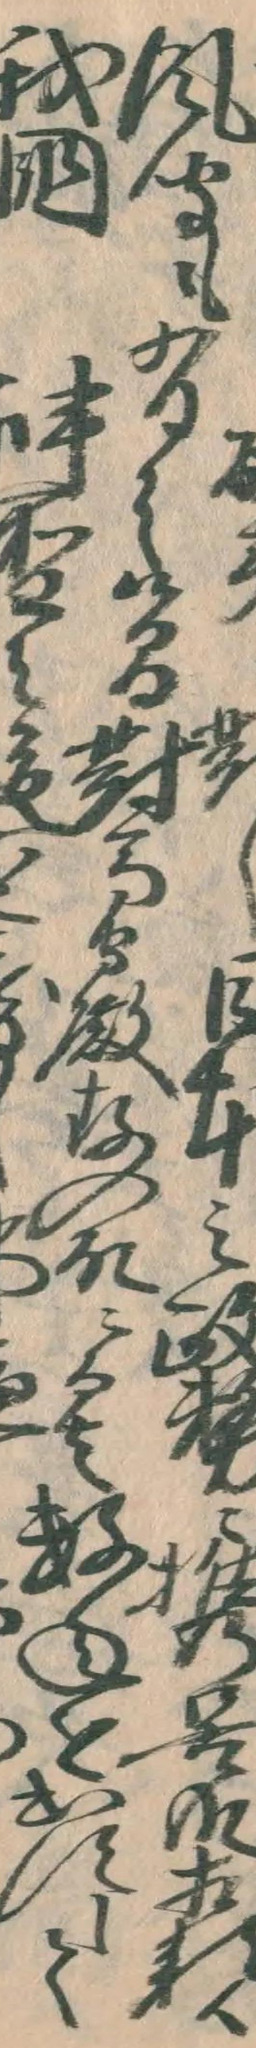風聞も有之候間對馬守殿存入様ニ而者数年を出すして
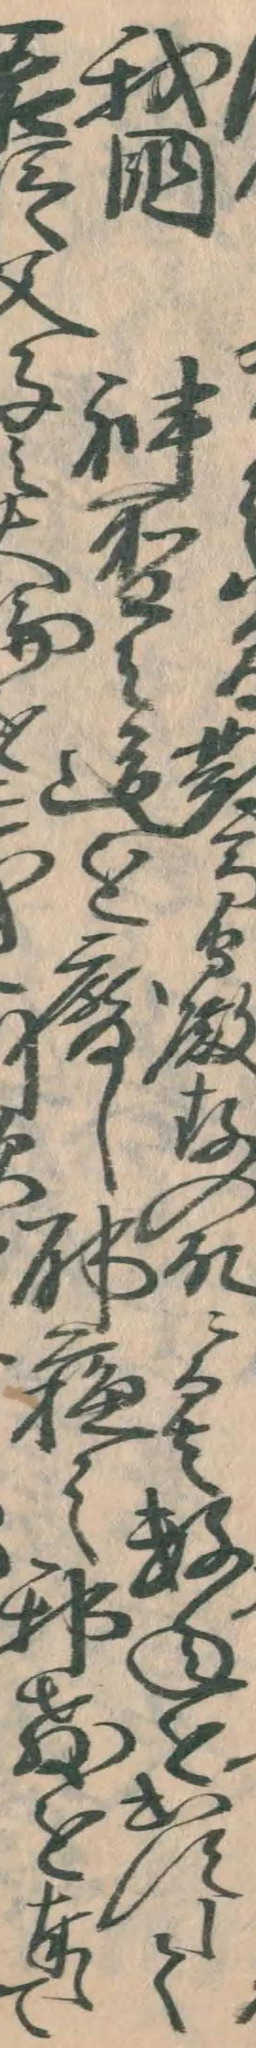我国神聖之道を廃し耶蘇之邪教を奉候て
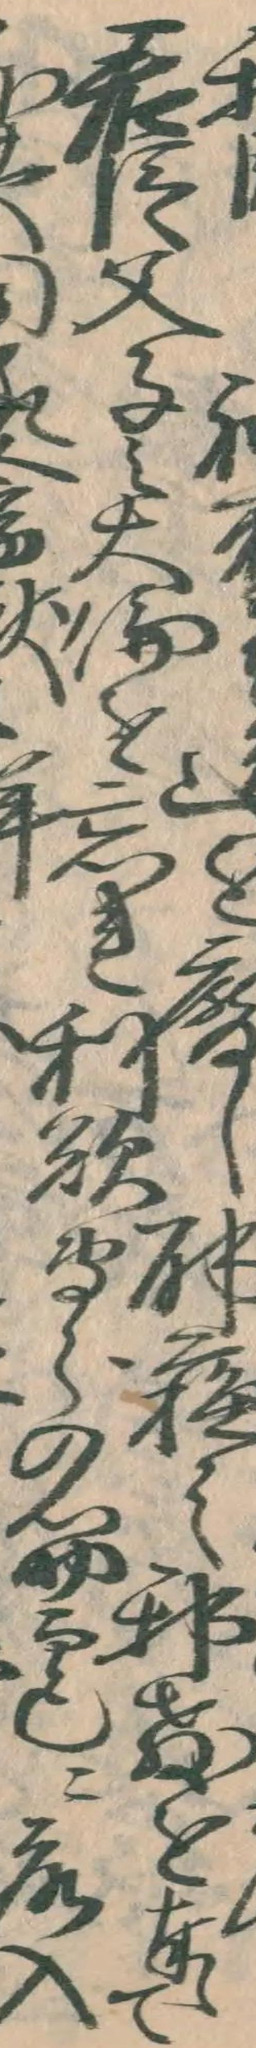君臣父子之大倫を忘れ利欲専らの筋而已ニ落入
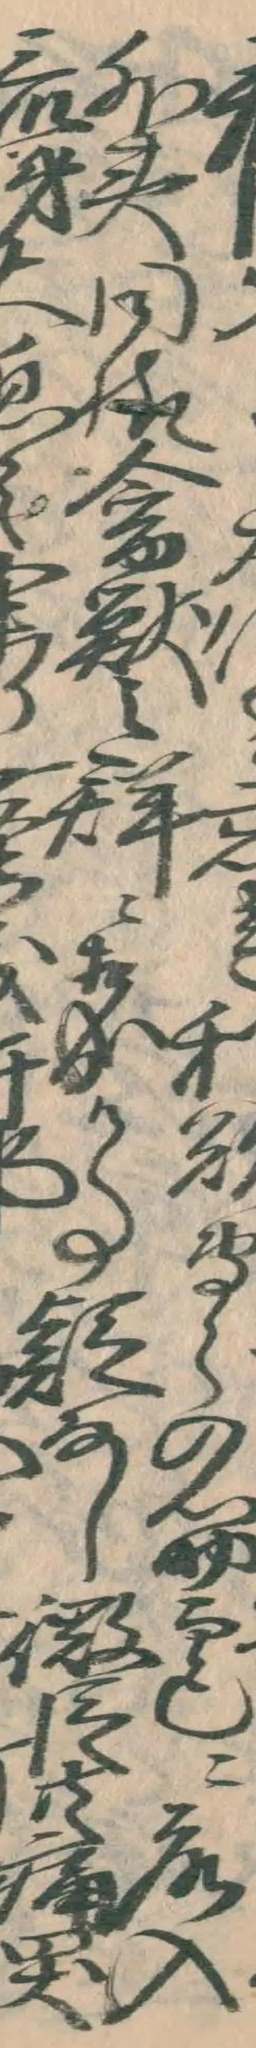外夷同様禽獣之群ニ相成候者疑なし微臣共痛哭
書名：麗斎叢書. 20
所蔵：国立国会図書館 National Diet Library, JAPAN
